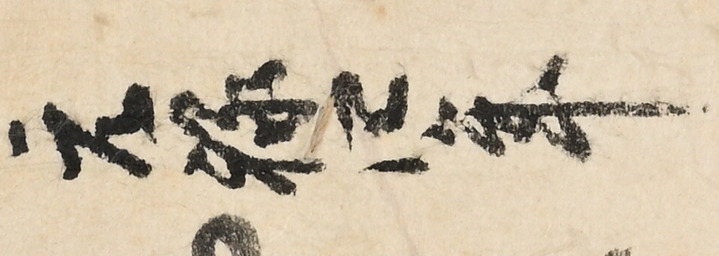元禄四年
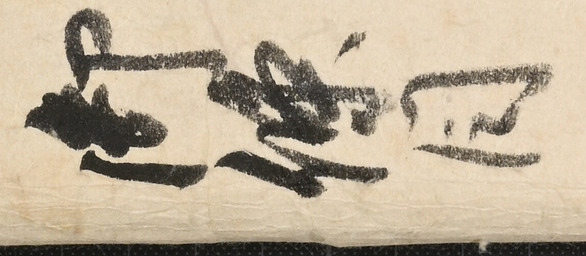御條目

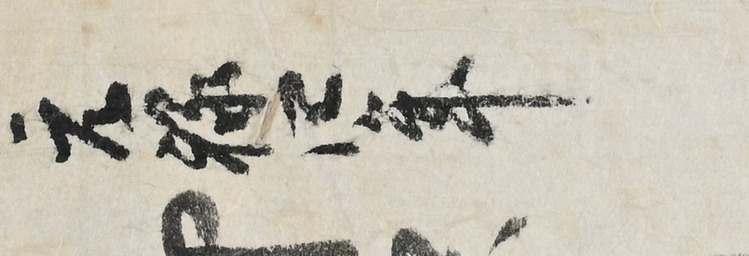元禄四年
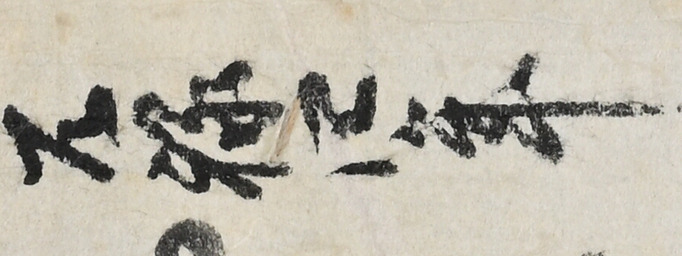元禄四年
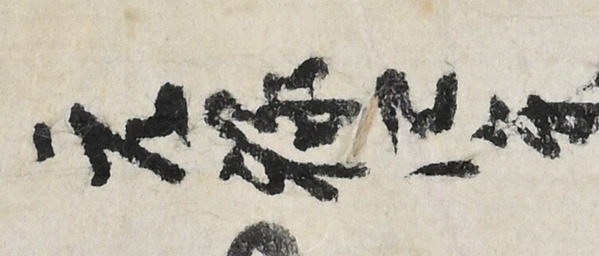元禄四年
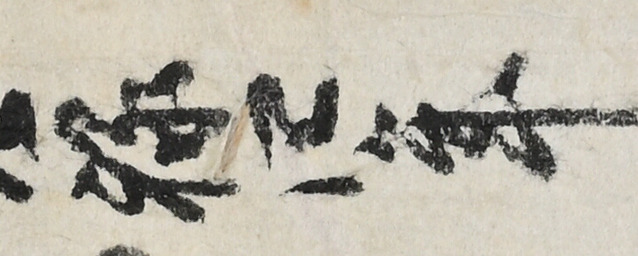元禄四年
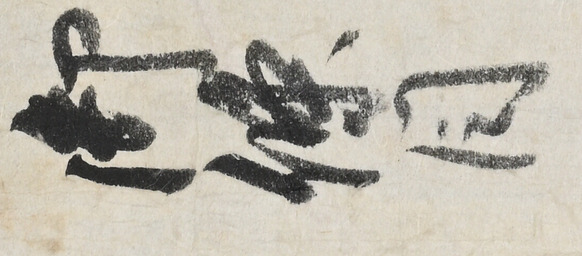御條目

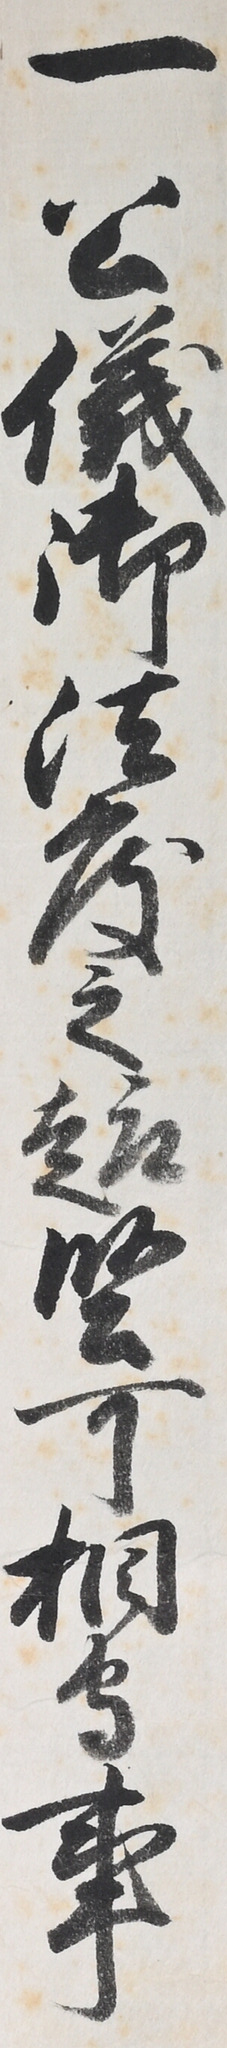一公儀御法度之趣堅可相守事
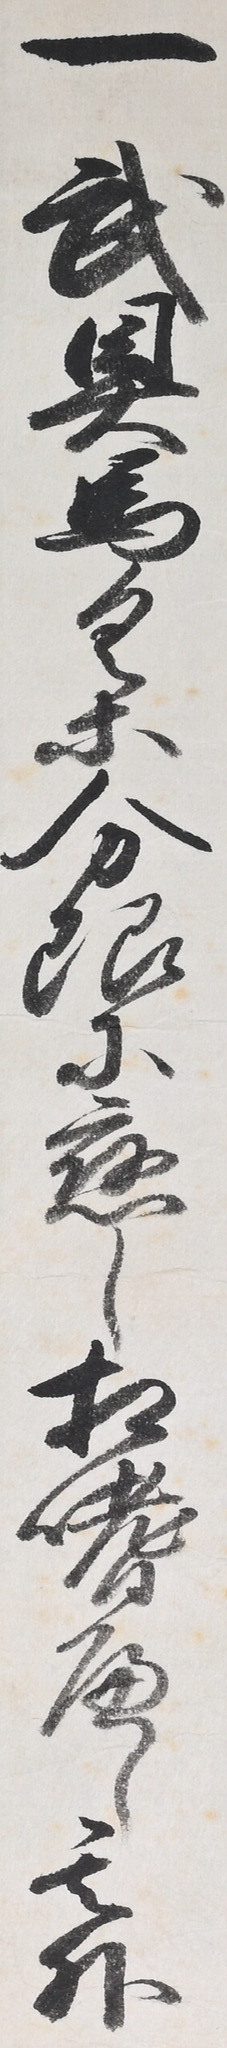一武具馬具等分限に應し相嗜へし其外
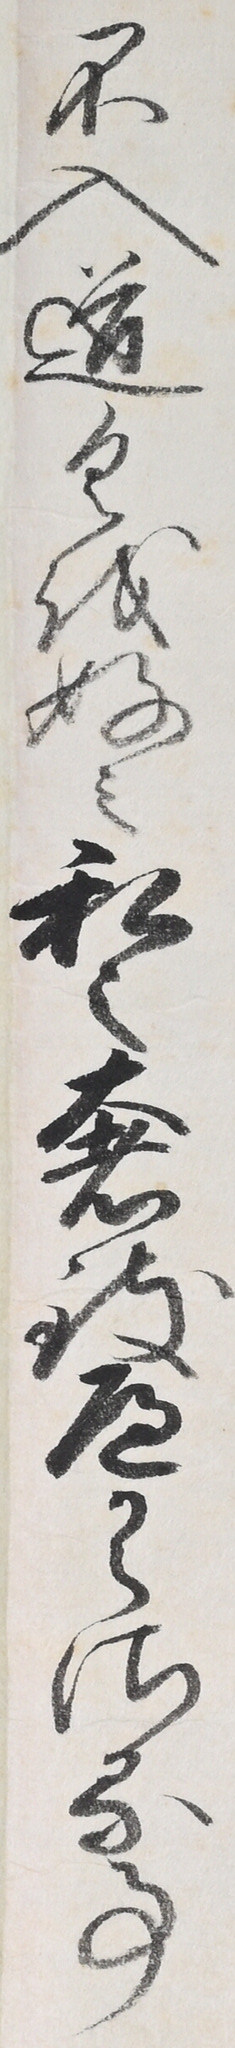不入道具を好ミ私之奢致へからさる事
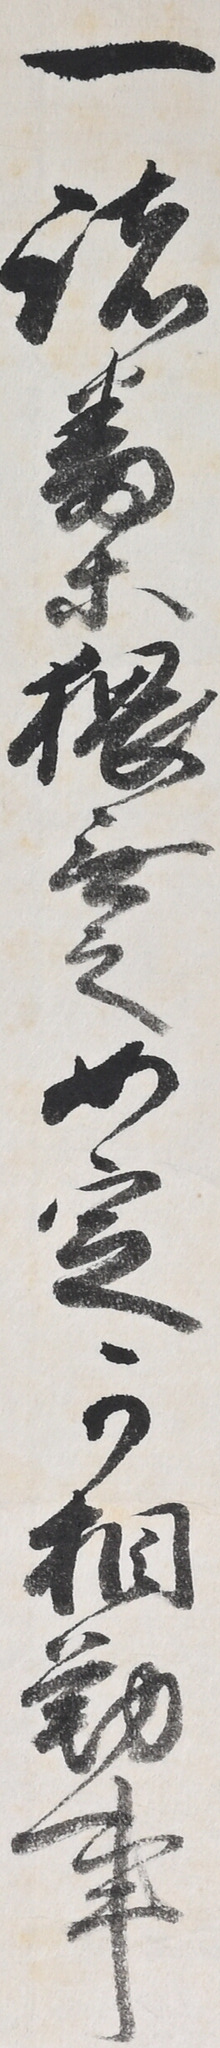一諸番等猥無之如定可相勤事
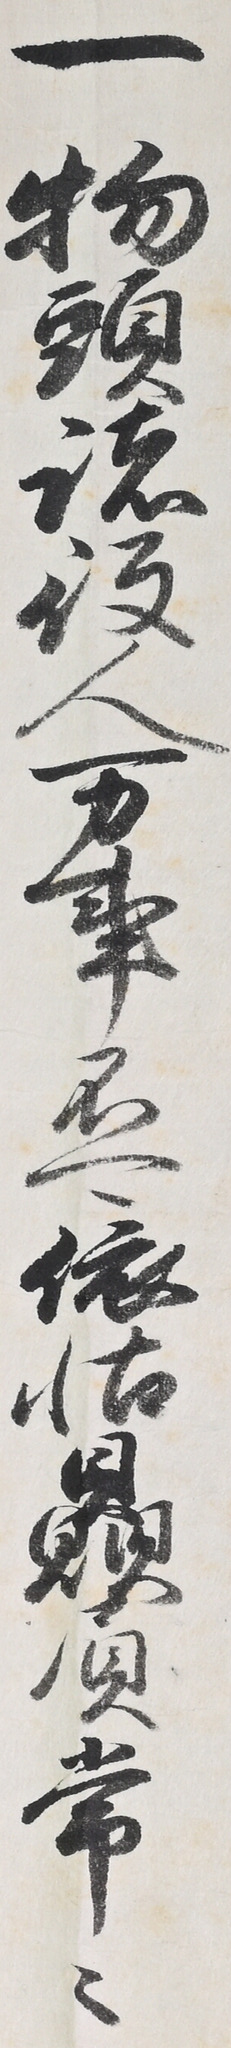一物頭諸役人万事不可依怙贔屓常々
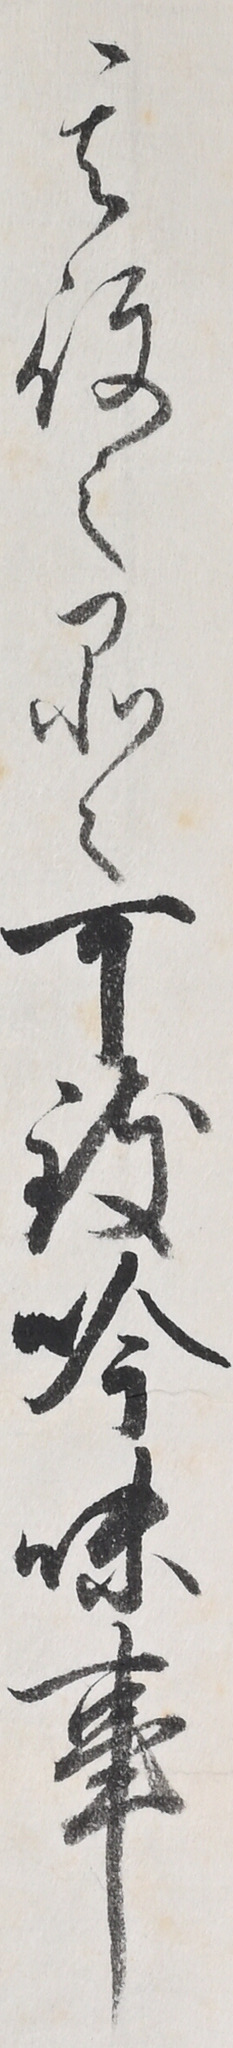其役之品々可致吟味事
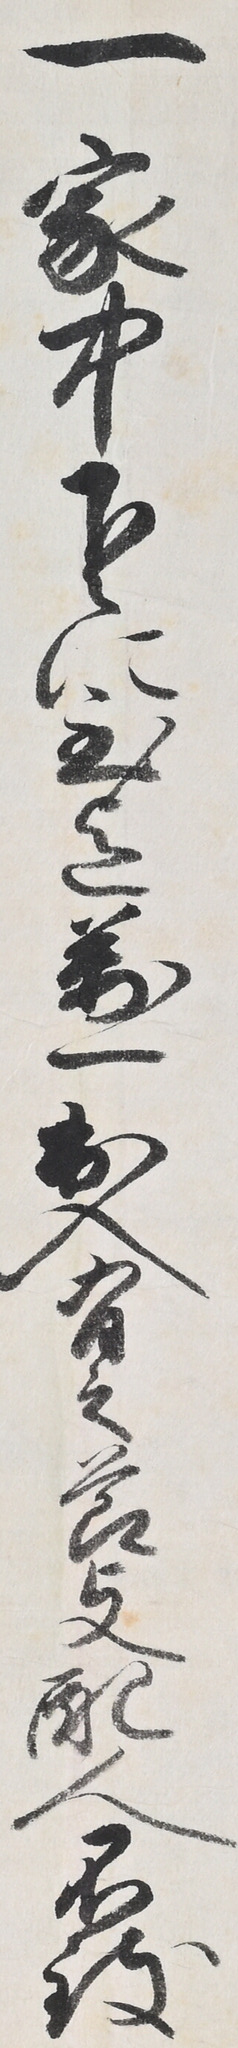一家中下々に至迄萬一出入有之節支配人不致
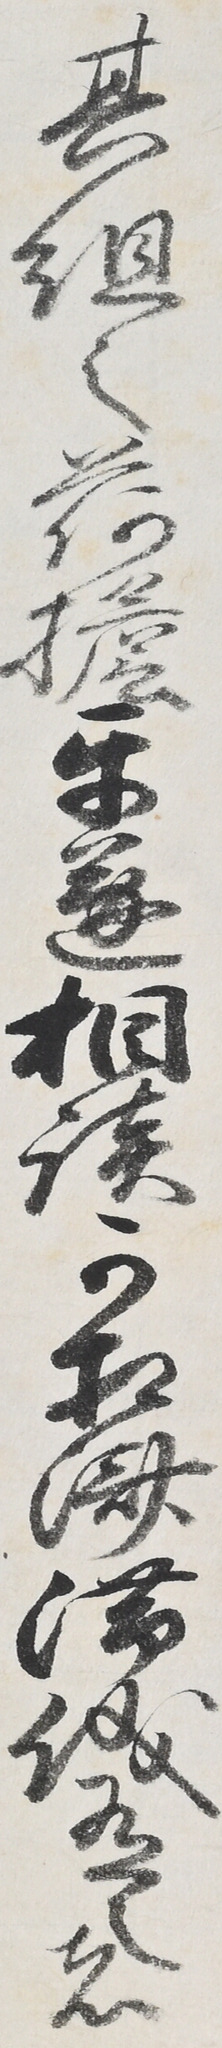其組之荷擔互遂相談可相済滞儀有之者
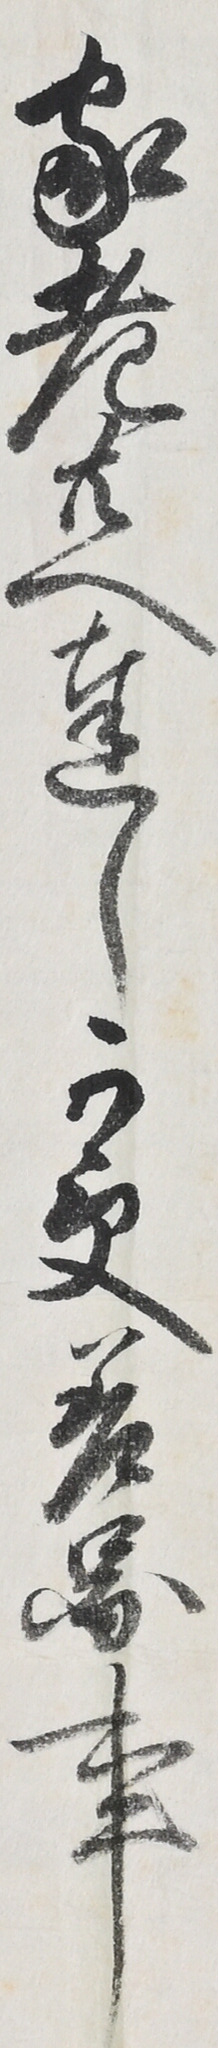家老共へ達し可受差図事
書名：御条目
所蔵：伊那市立高遠町図書館・合同会社AMANE
